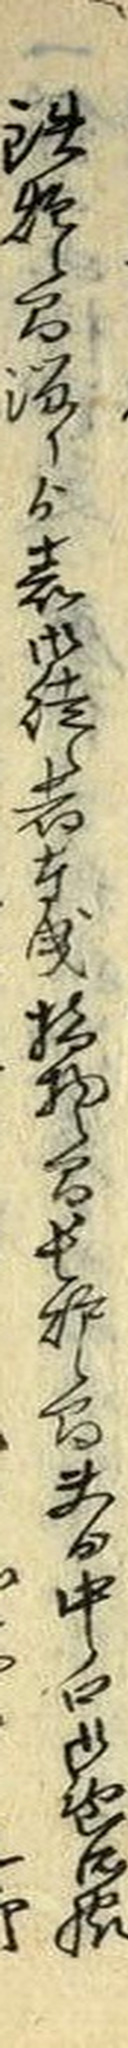鉄炮之間溜りゟ表御徒之者奉曳指物之間長炉之間夫ゟ中之口御台所脇
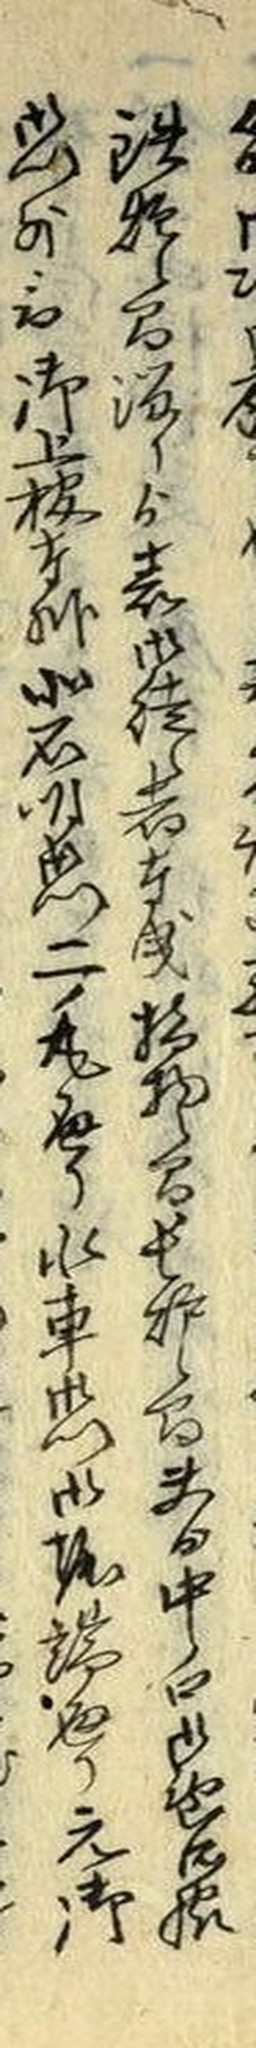御門外ニ而御上棺奉掛北不明御門二之丸通り水車御門御堀端通り元御
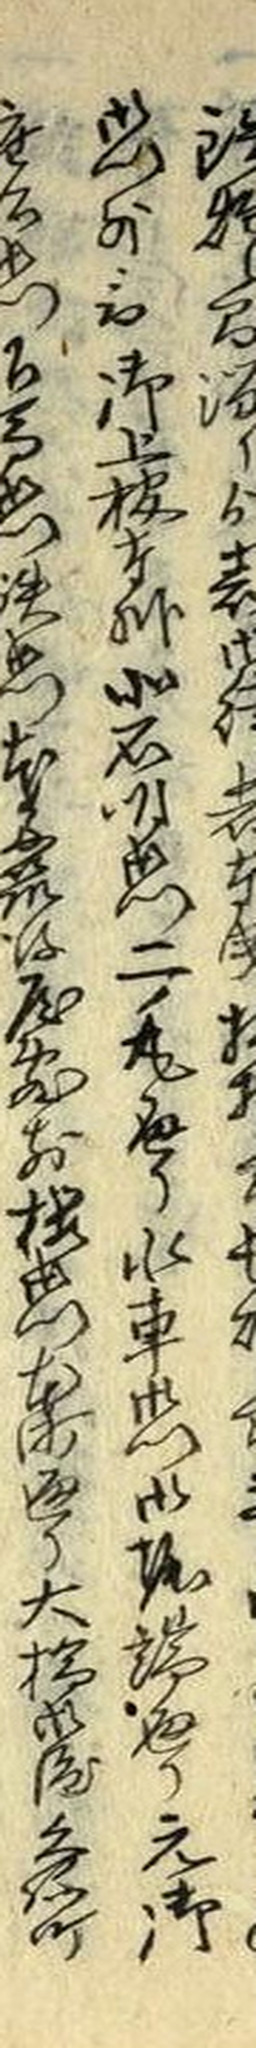座所御門下馬御門鉄御門本多筑後屋敷前桜御門本町通り大橋御渡久保町
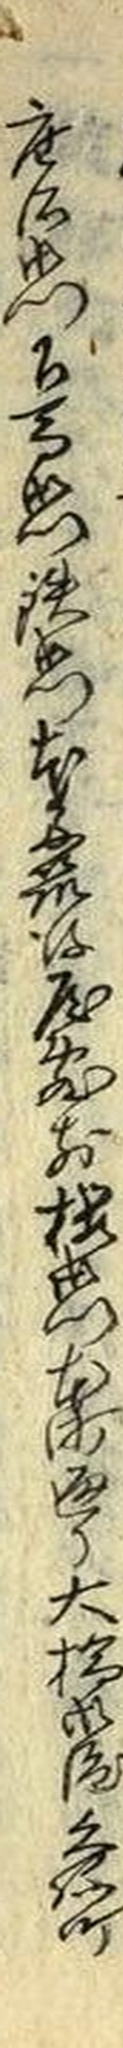座所御門下馬御門鉄御門本多筑後屋敷前桜御門本町通り大橋御渡久保町
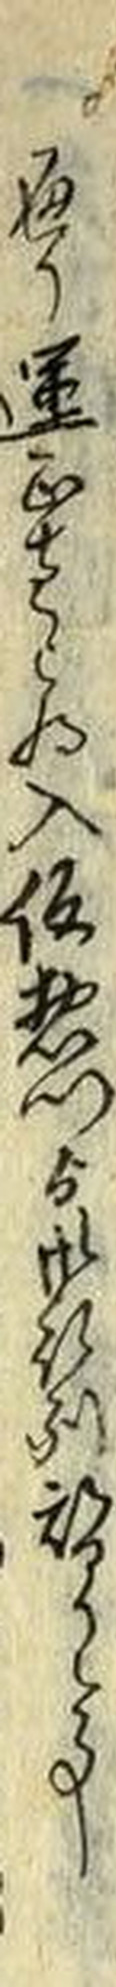通り運正寺へ被為入仮惣門ゟ御行列替り候事
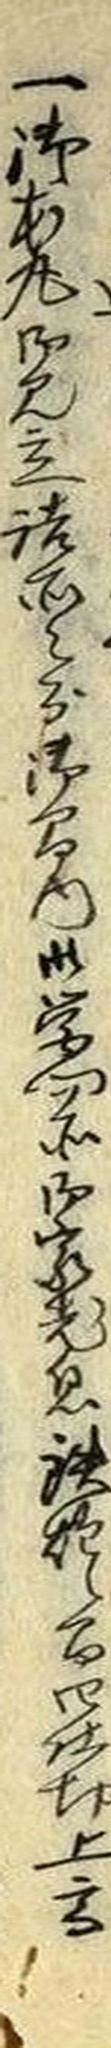一御本丸御見立詰所之分御間内御学問所御家老息鉄炮之間四仕切上高
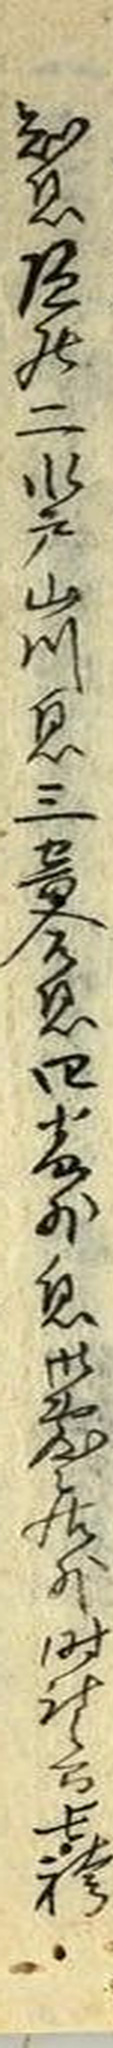知息隠居二水戸山川息三寄合息四番外息御敷居外時計之間長袴
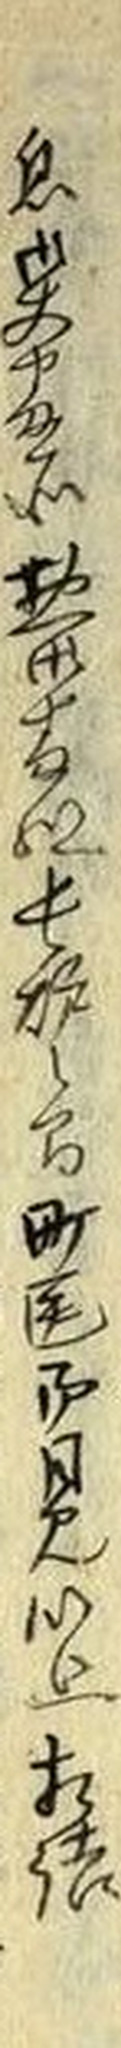息御使番所惣御番組長炉之間町医御目見以上相詰
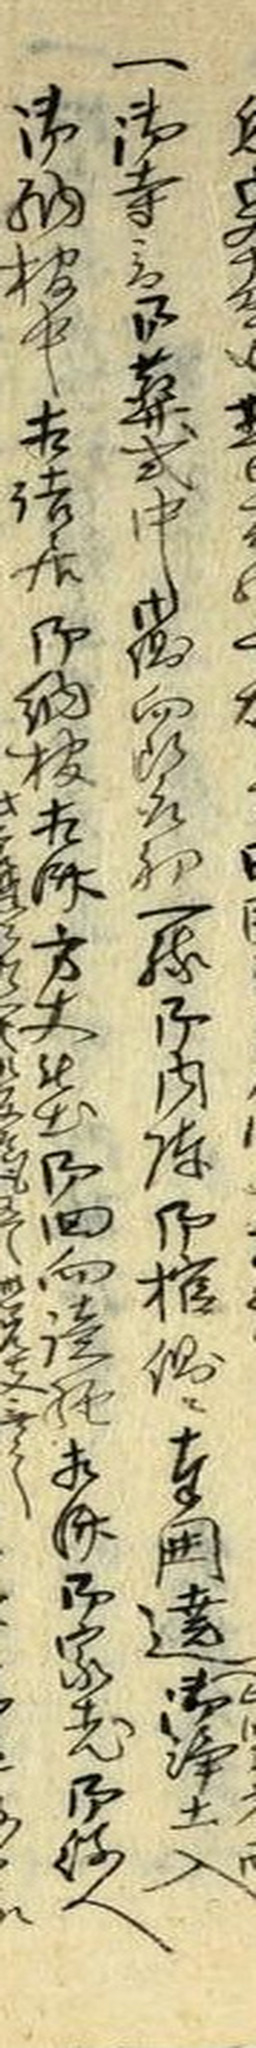御納棺中相詰居御納棺相済方丈罷出御回向読経相済御家老御役人
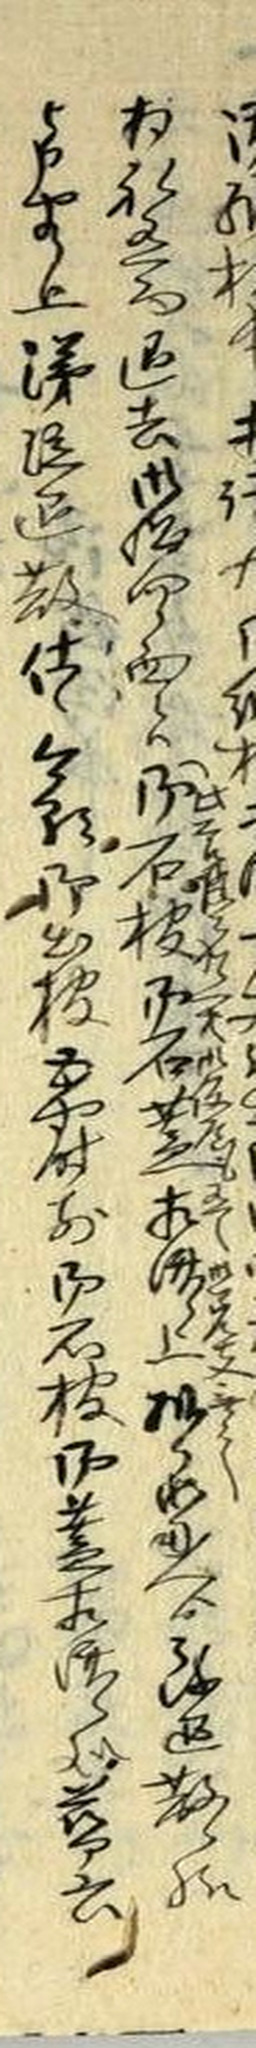被申聞候上涕泣退散仕候今朝御出棺五半時前御石棺御蓋相済候処暮六
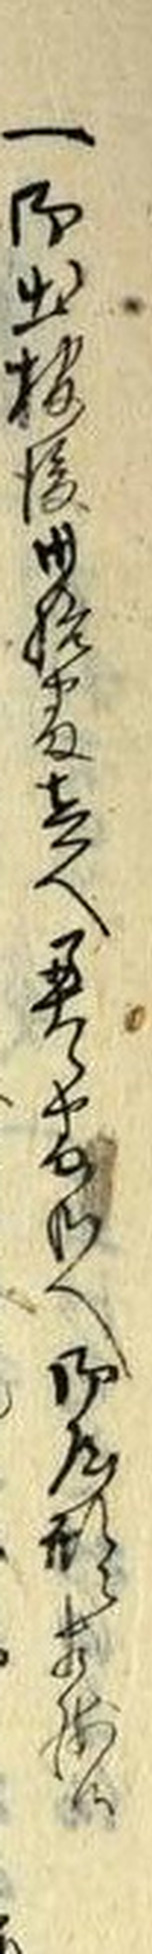一御出棺後御膳番壱人奥之番弐人御屋形へ相残候
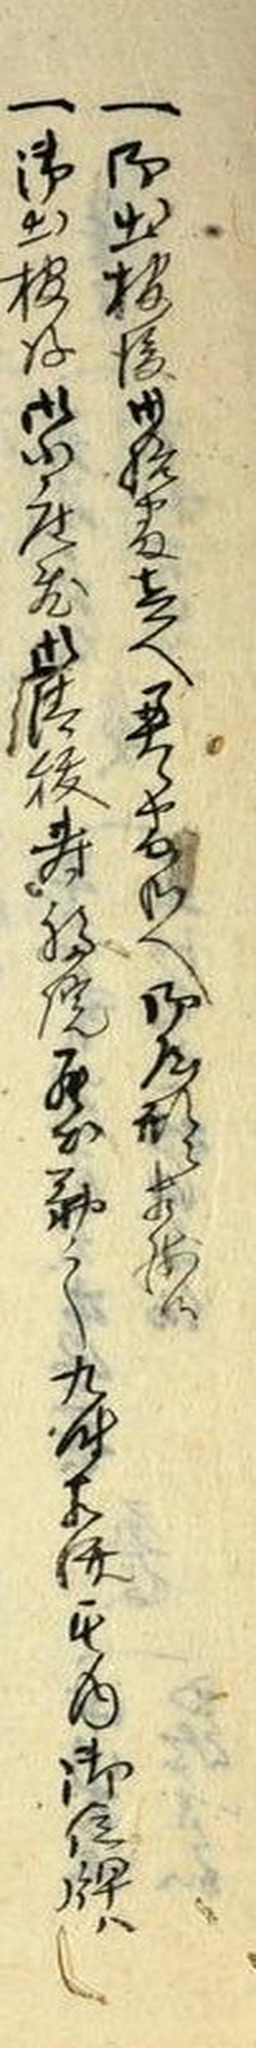一御出棺後御小座敷御清祓寿福院罷出勤之九時相済其内御位牌ハ
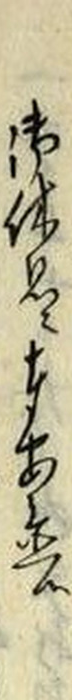御休息ニ奉安置候
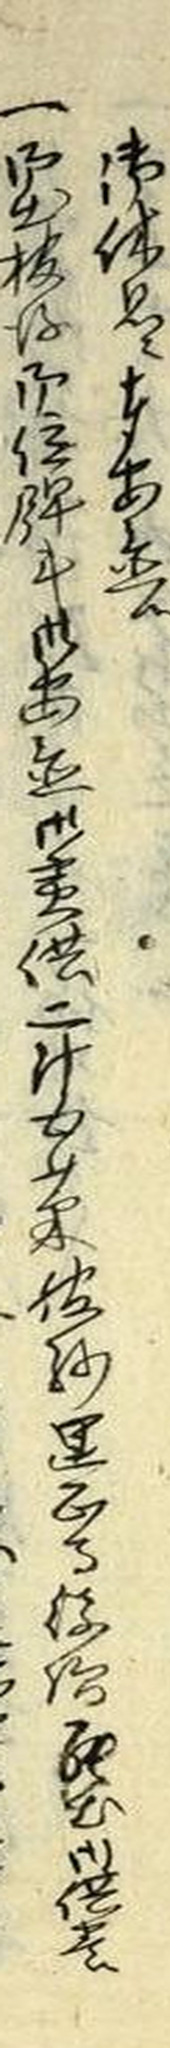一御出棺後御位牌斗御安置御霊供二汁五菜服紗運正寺役僧罷出御供養
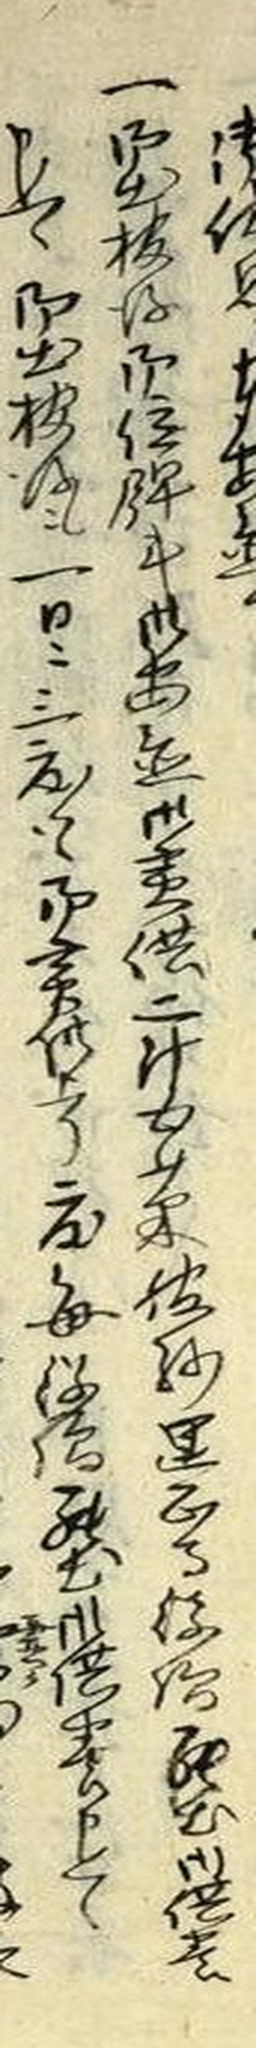申上候御出棺後も一日ニ三度ツヽ御霊供上り度毎役僧罷出御供養申上候
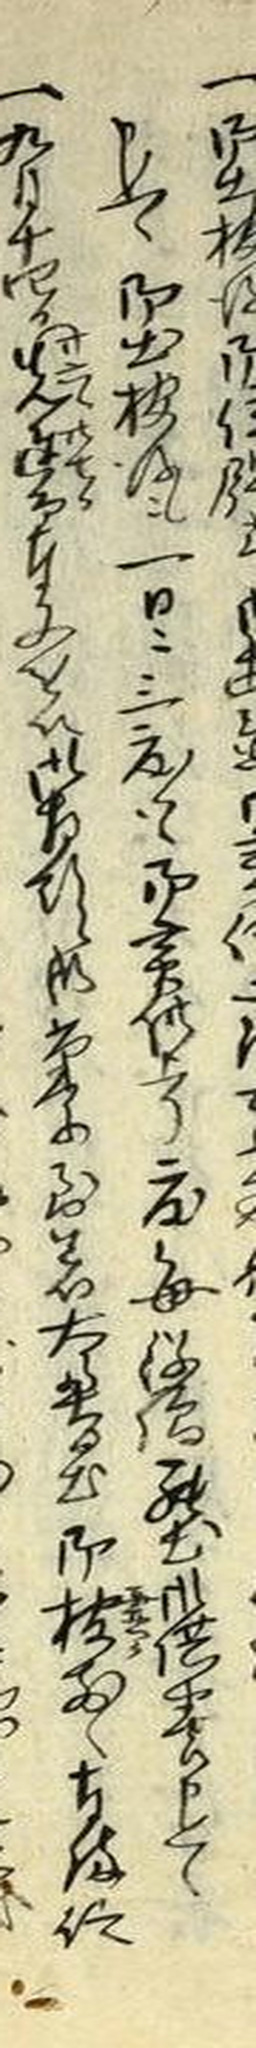一九月十四日廿六日廿七日先達而奉文を以御拝領御菓子到着大奥ゟ出御棺前へ奉備跡
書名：少傅日録抄（斉善付側向頭取日記、江戸并道中、初入在国、逝去後…
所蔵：福井県文書館 Fukui Prefectural Archives
